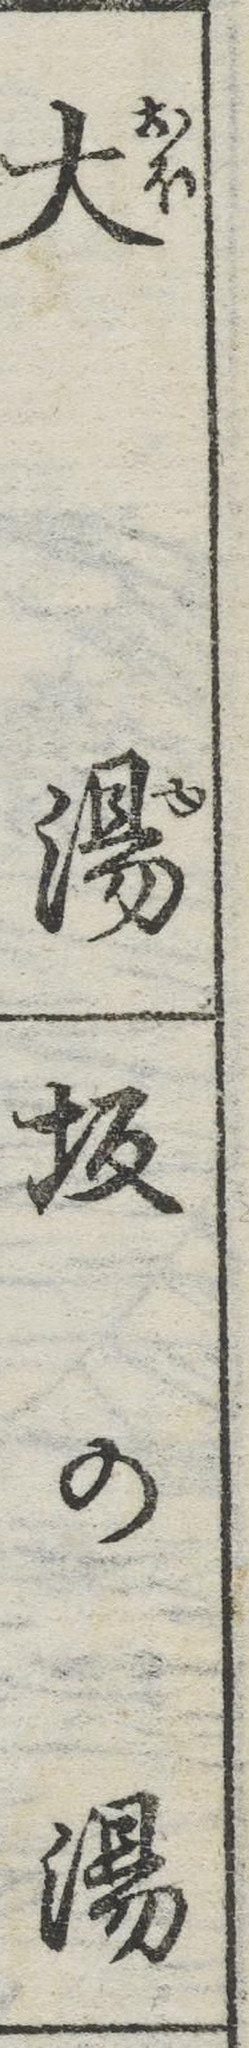大湯坂の湯
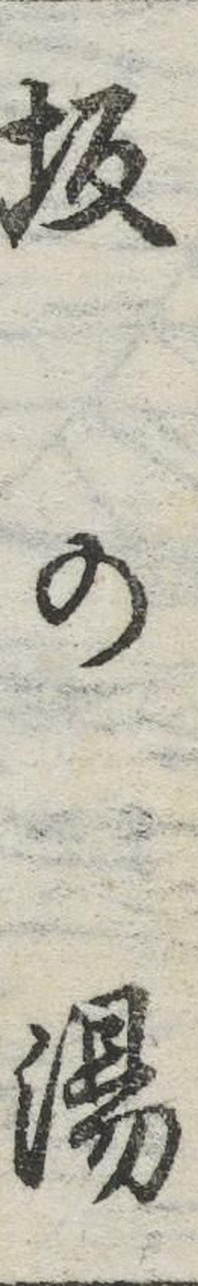瀧の湯
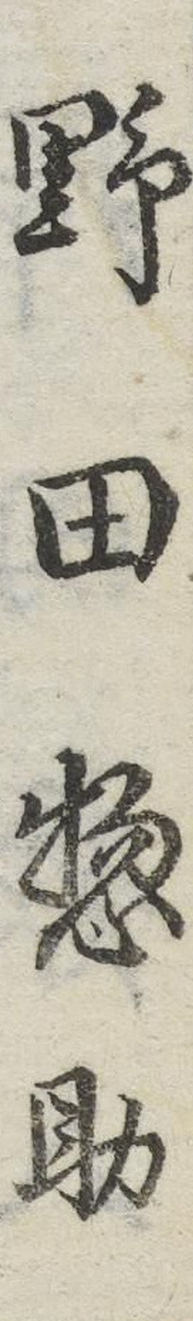野田惣助
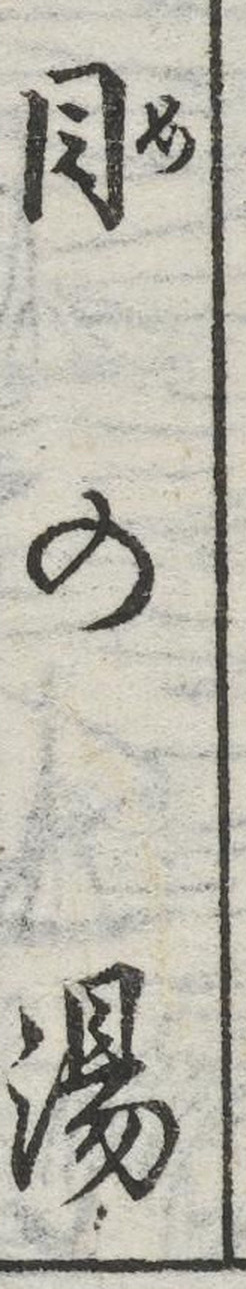瀧の湯
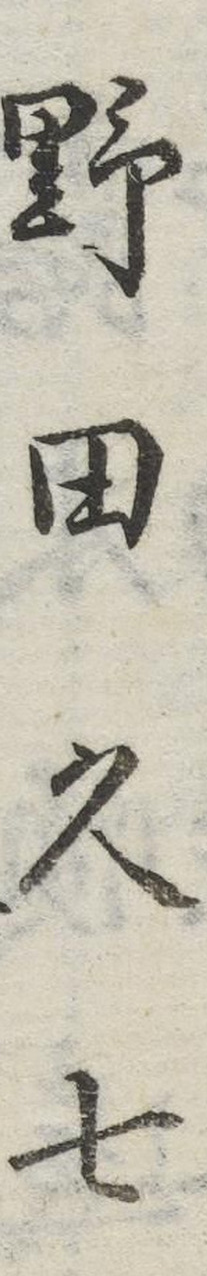野田久七
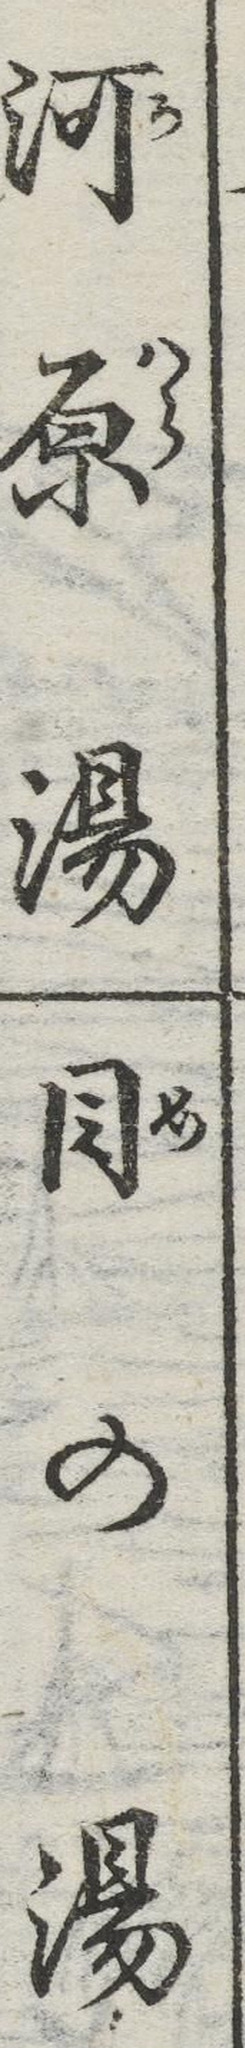河原湯目の湯
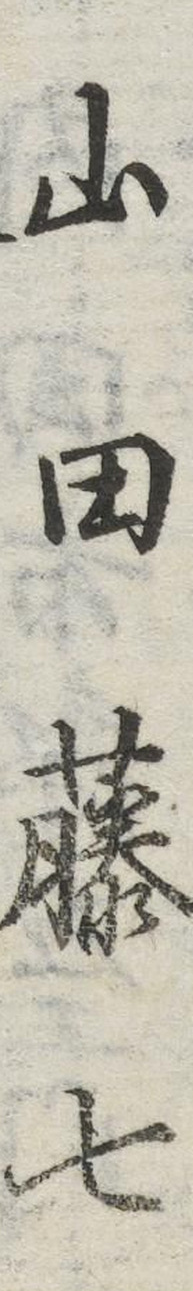山田藤七
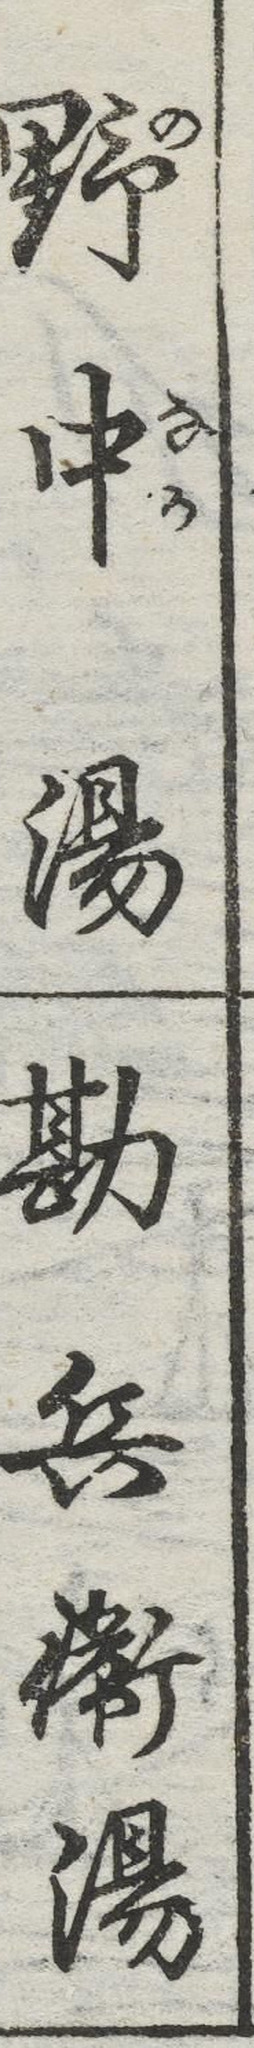野中湯勘兵衛湯
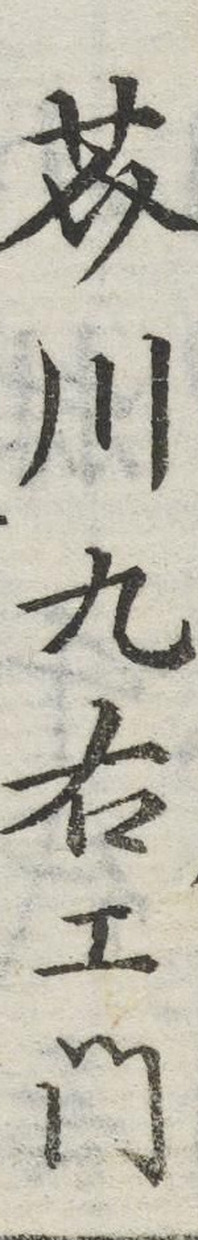芥川九右エ門
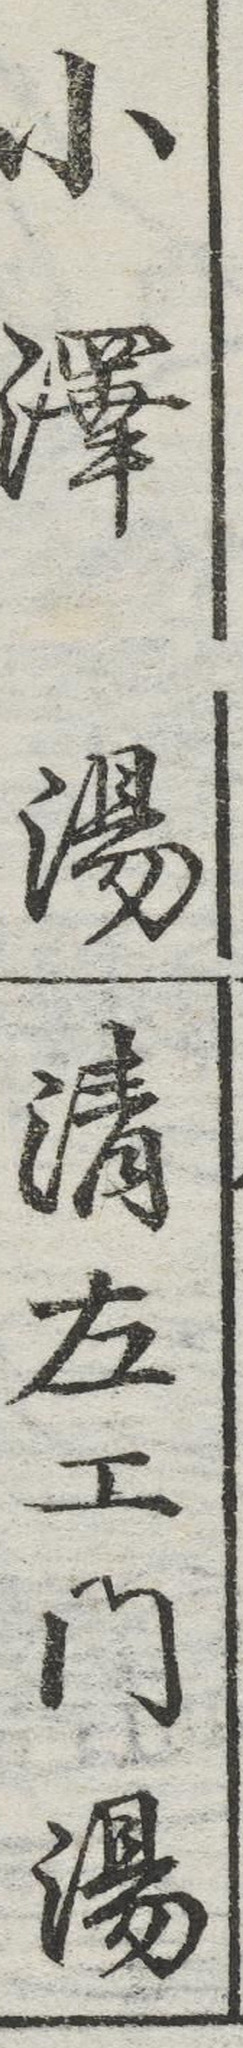小澤湯清左エ門湯
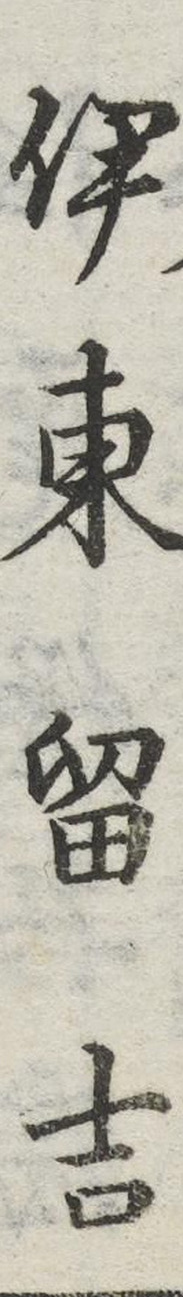伊東留吉
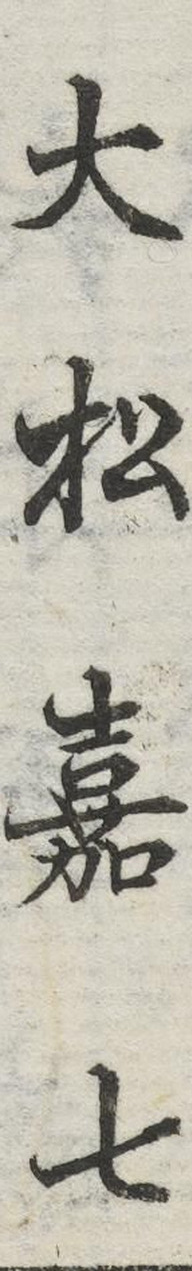大松嘉七
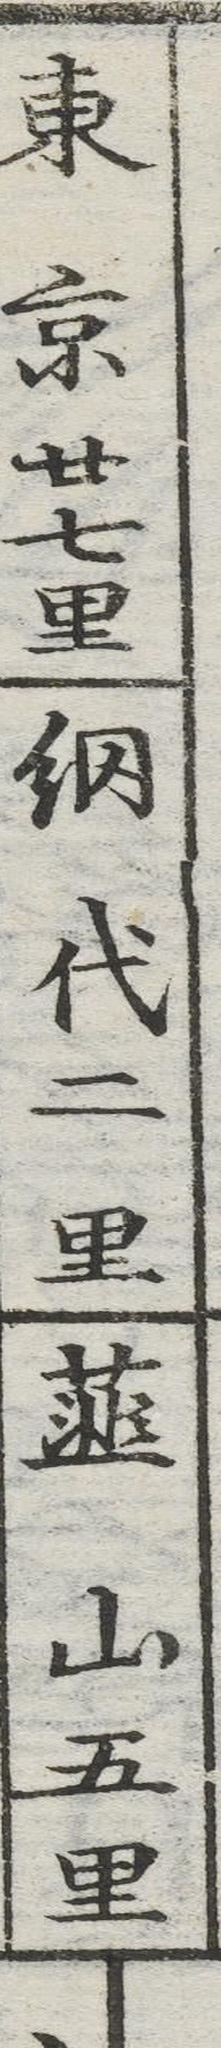東京廿七里網代二里韮山五里
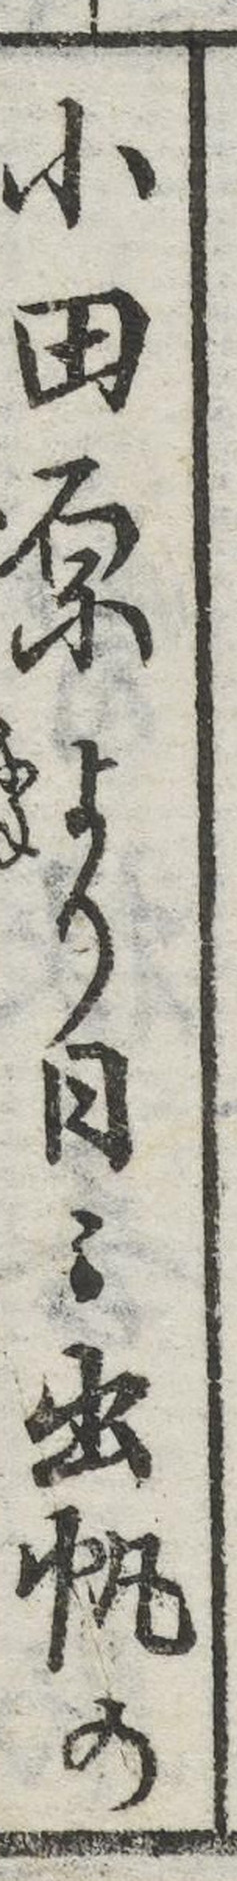小田原より日々出帆の
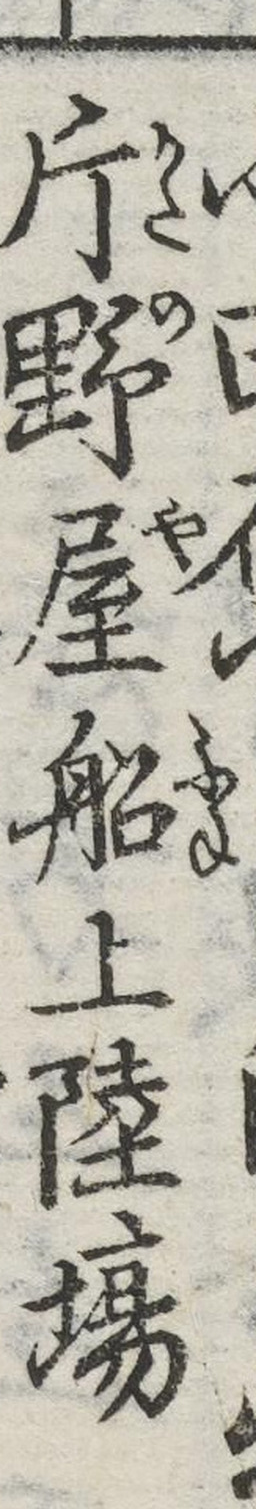片野屋船上陸場
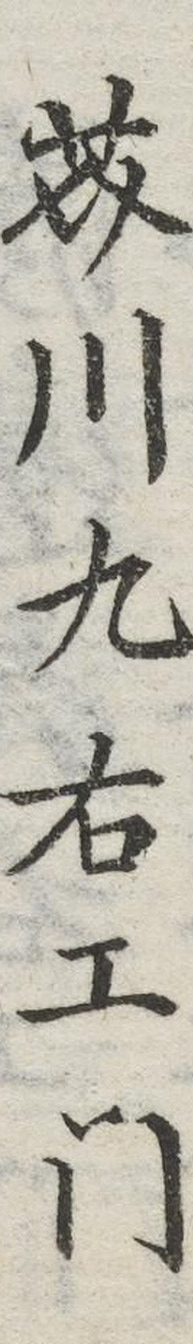芥川九右エ門
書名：諸國温泉遊覽記　全
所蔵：東京大学地震研究所図書室 Earthquake Research Institute Library, The University of Tokyo, JAPAN
